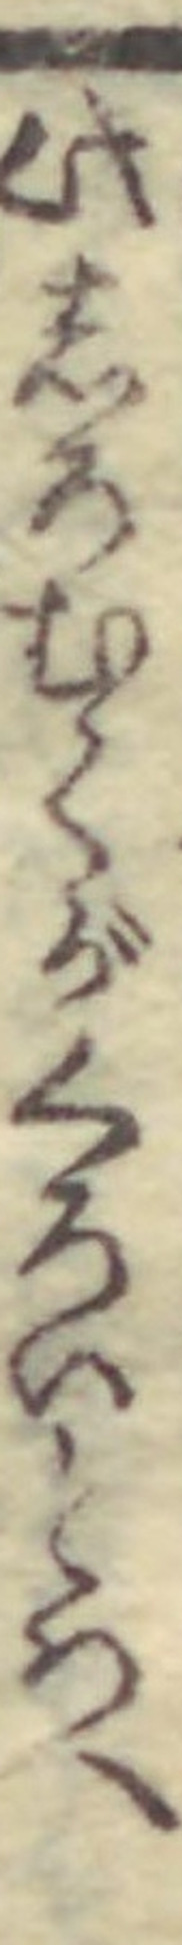此しろむくがくろいとはへ
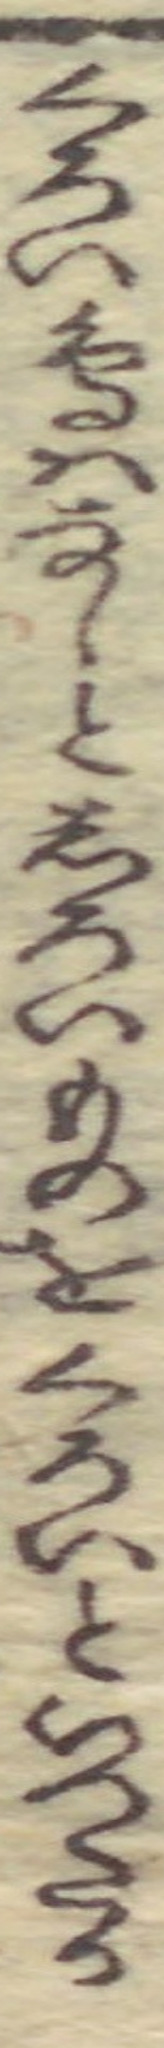くろい鳥はなしとしろいものをくろいといつたか
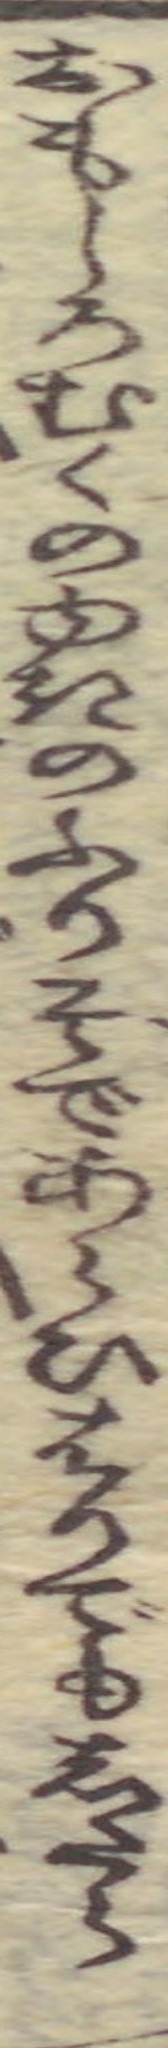おもしろむくのゆきのゆりそであらいはりでもしたら
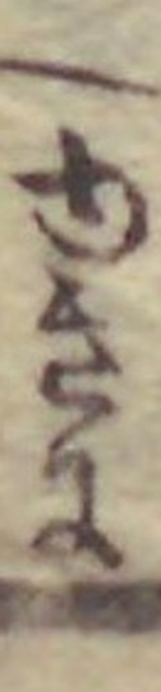ゆきに
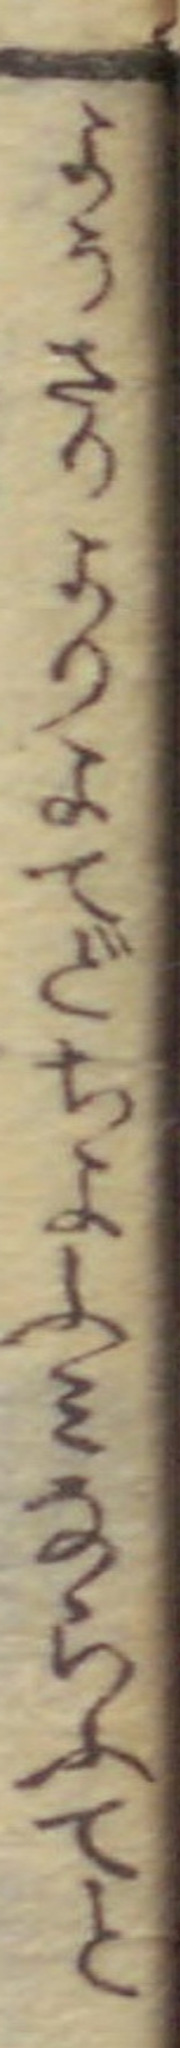ようさりよりにてどちよふみならふてと
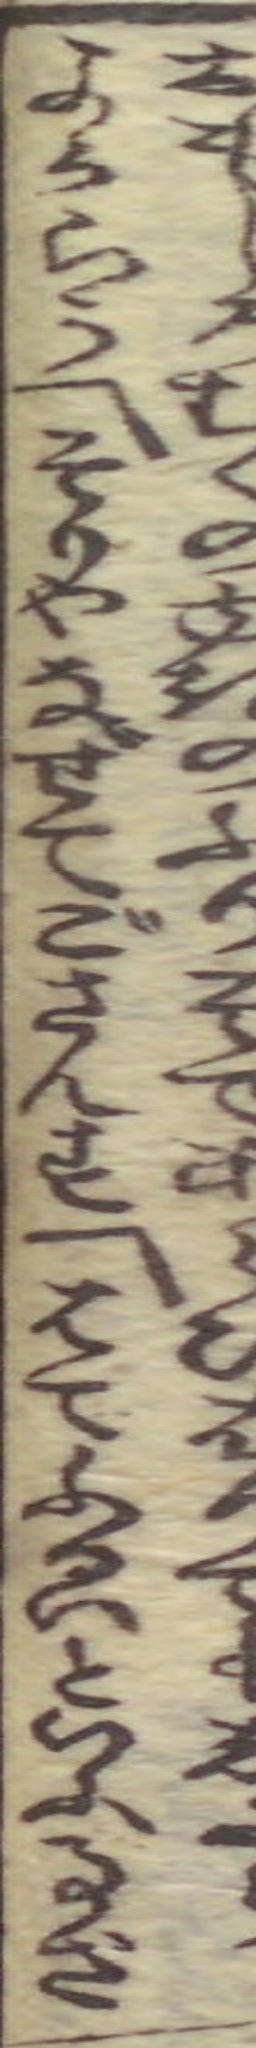よからう〽そりやなぜてござんす〽はてふるいといふ事だ
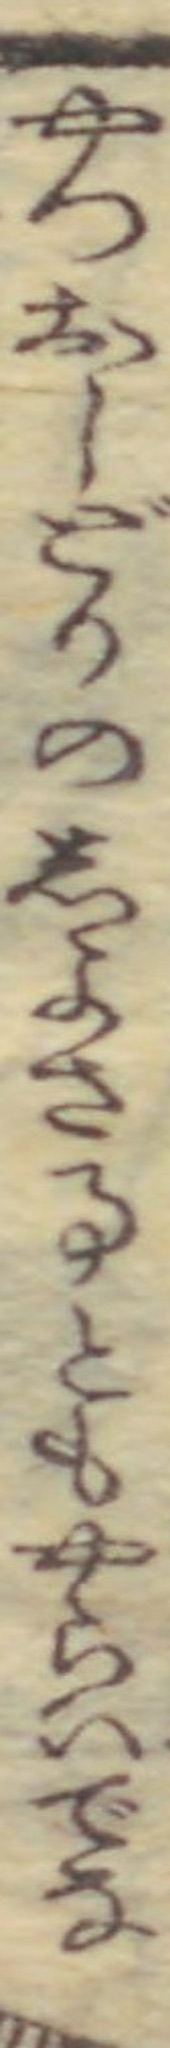やつおしどりのしよさ事ともやらいでな
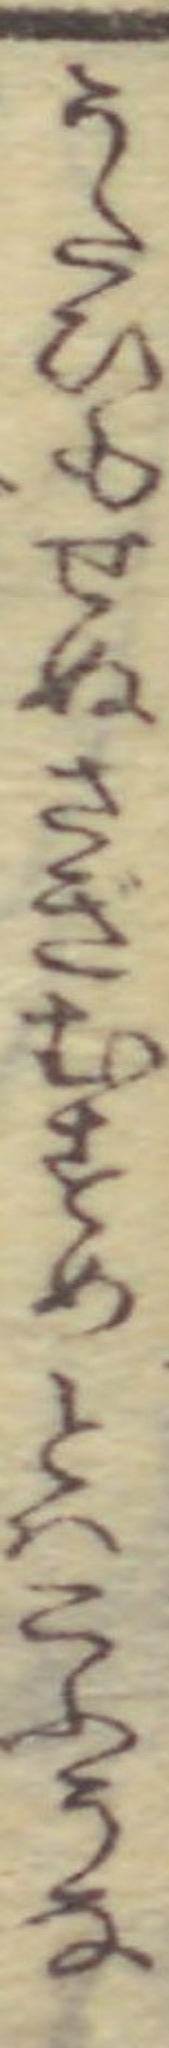うたひもせぬさぎむすめとはこふうな
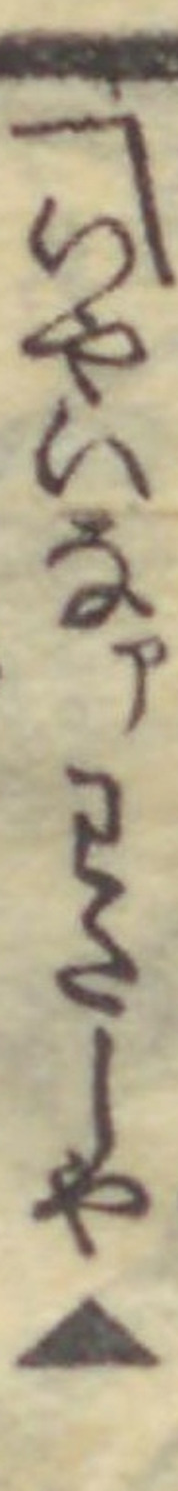〽いやいなァわたしや▲
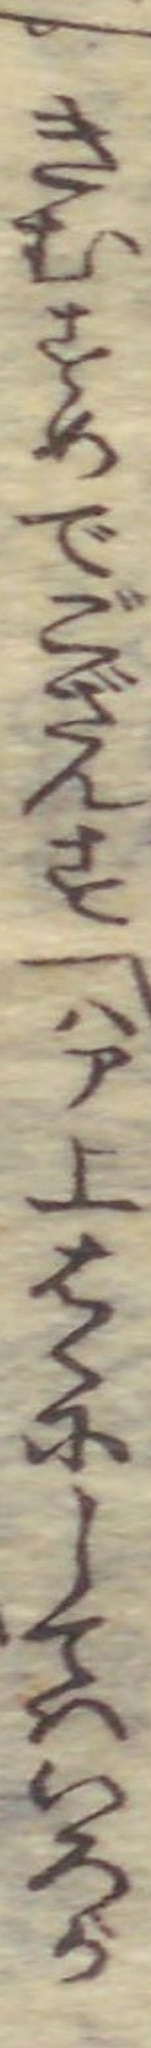きむすめでござんす〽ハア上はくにしてはいろが
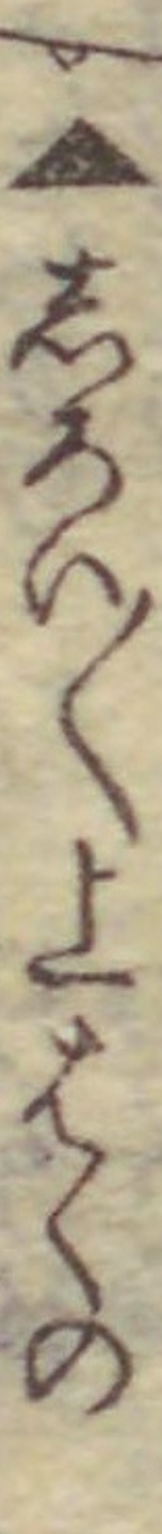▲しろい〳〵上はくの
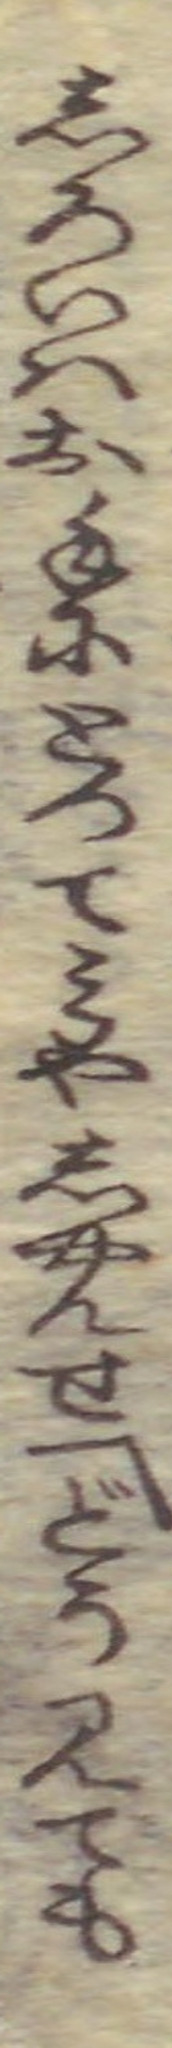しろいはお手にとつてみやしやんせ〽どう見ても
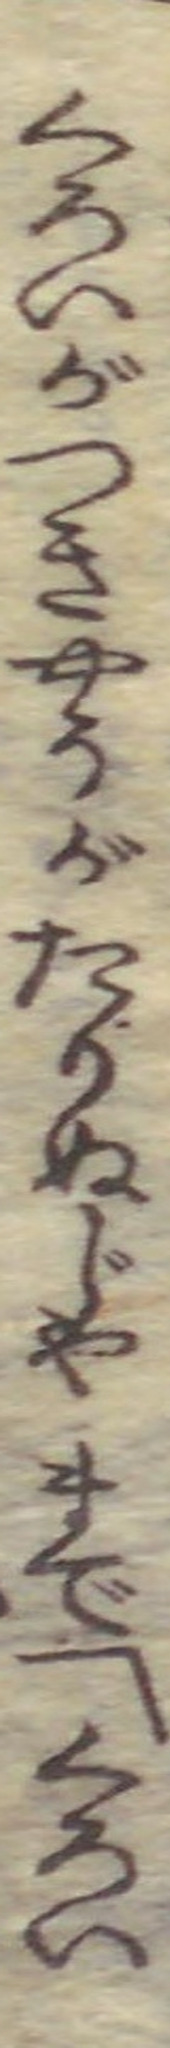くろいがつきやうがたりぬじやまで〽くろい
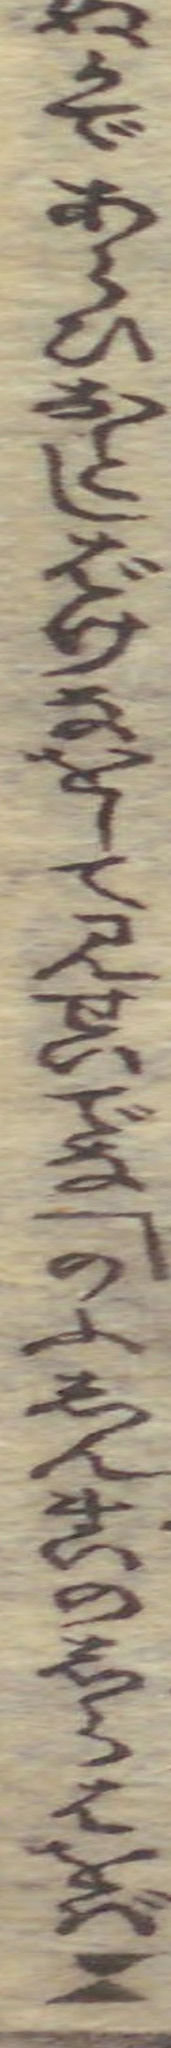ぬかであらひおとしばけなをして見せいでな〽のふしんまいのしらはをば▼▲
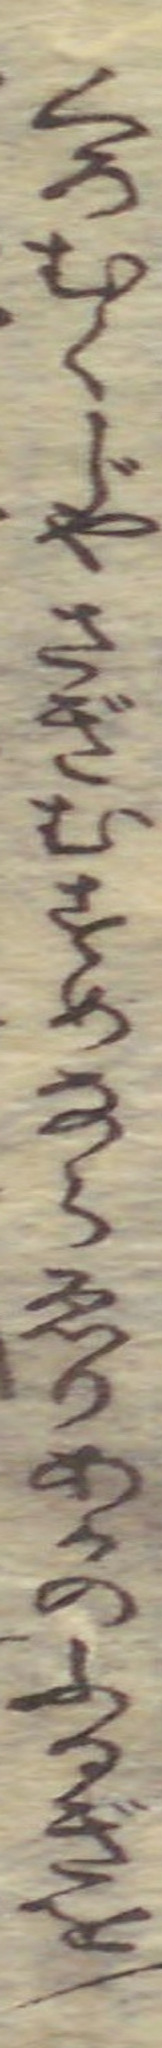くろむくじやさぎむすめならゑりあかのふるぎを

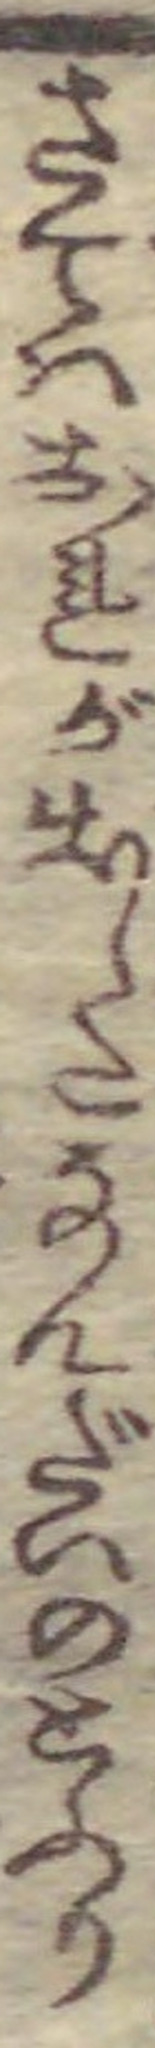さてはおれが出したなんだいのとふり
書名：大時代唐土化物 3巻. 曽我太夫染
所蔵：国立国会図書館 National Diet Library, JAPAN
